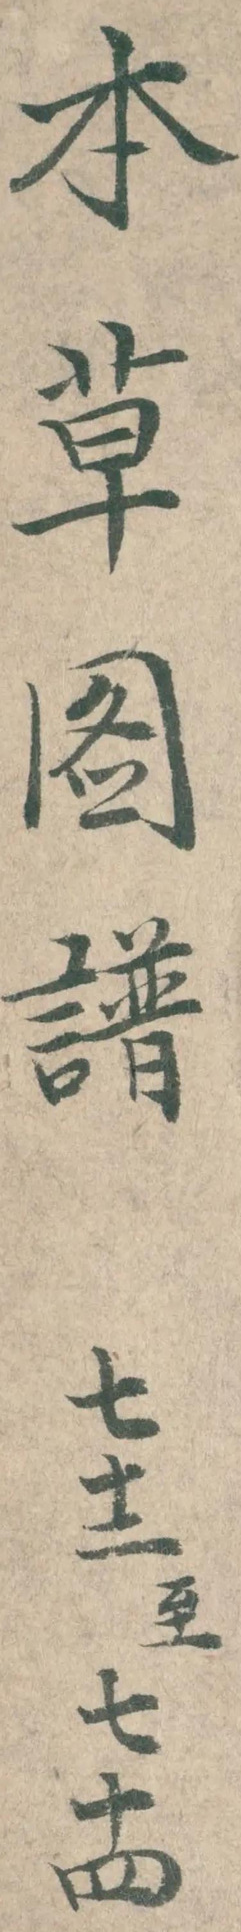本草図譜七十二至七十四
